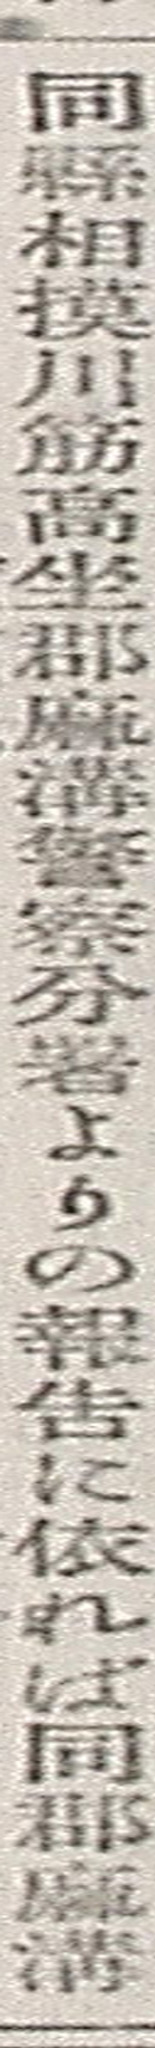同県相模川筋高坐郡麻溝警察分署よりの報告に依れば同郡麻溝
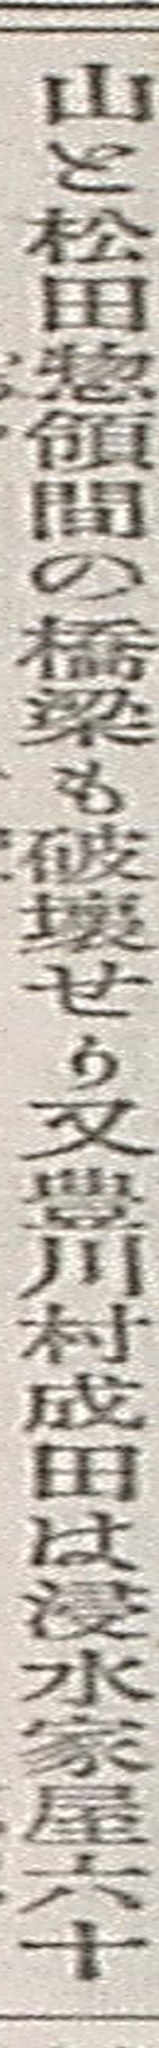山と松田総領間の橋梁も破壊せり又豊川村成田は浸水家屋六十
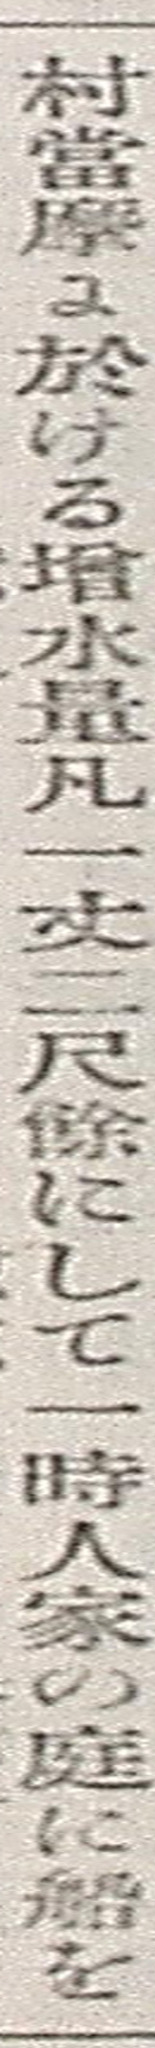村当摩に於ける増水量凡一丈二尺餘にして一時人家の庭に船を
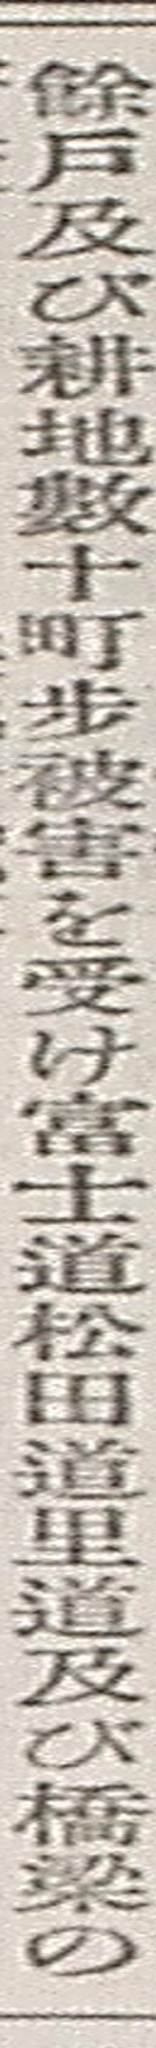餘戸及び耕地数十町歩被害を受け富士道松田道里路及び橋梁の
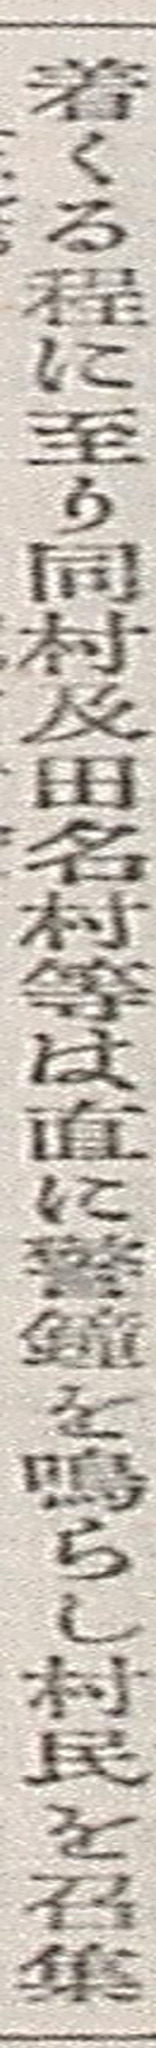着くる程に至り同村及田名村等は直に警鐘を鳴らし村民を招集
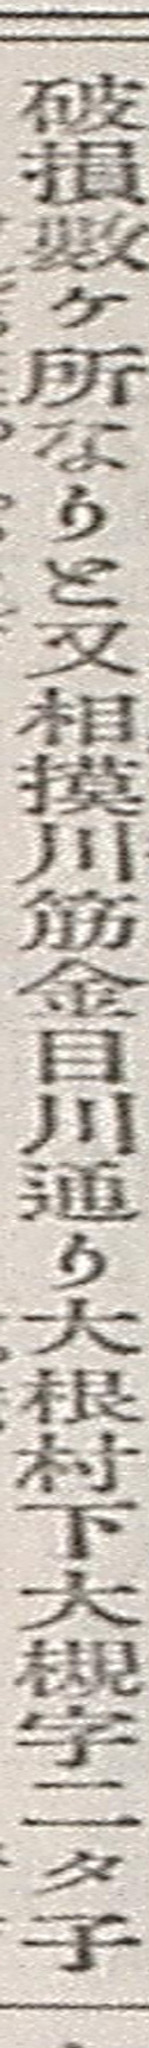破損数ヶ所なりと又相模川筋金目川通り大根村下大槻字二タ子
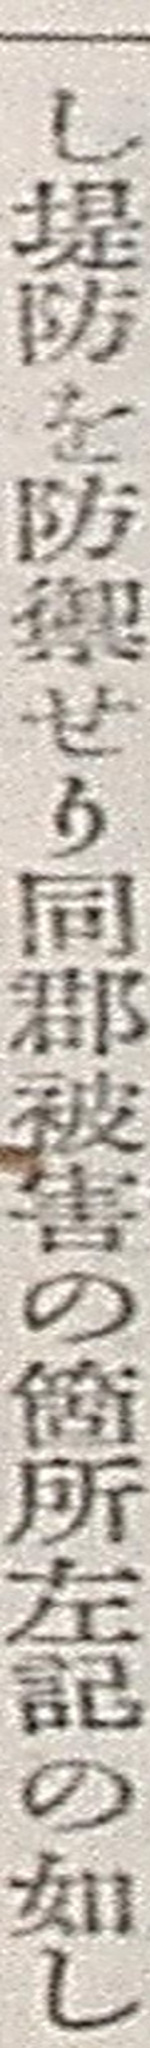し堤防を防禦せり同郡被害の箇所左記の如し
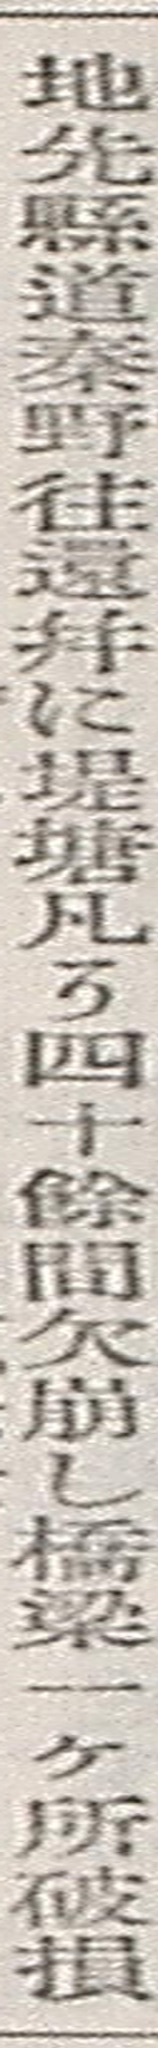地先県道秦野往還幷に堤塘凡そ四十餘間欠崩し橋梁一ヶ所破損
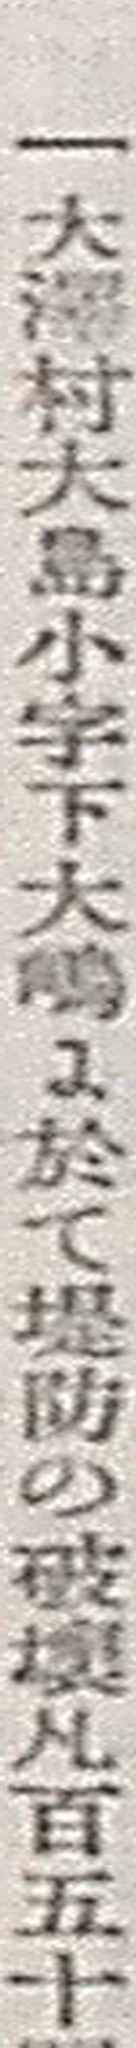一大沢村大島小字下大嶋に於て堤防の破壊凡百五十間
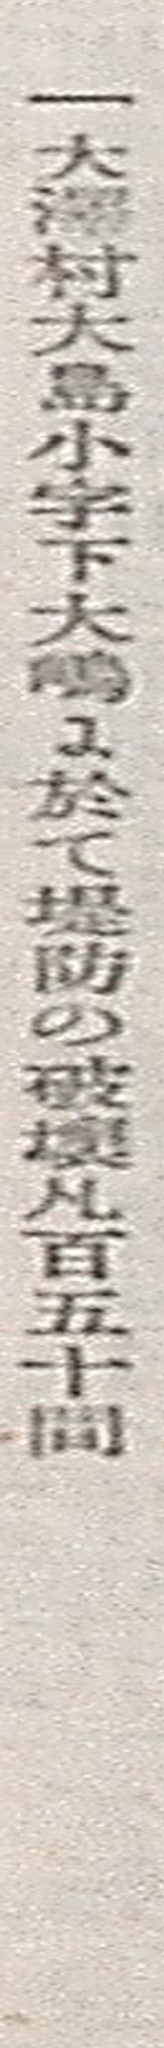一大沢村大島小字下大嶋に於て堤防の破壊凡百五十間
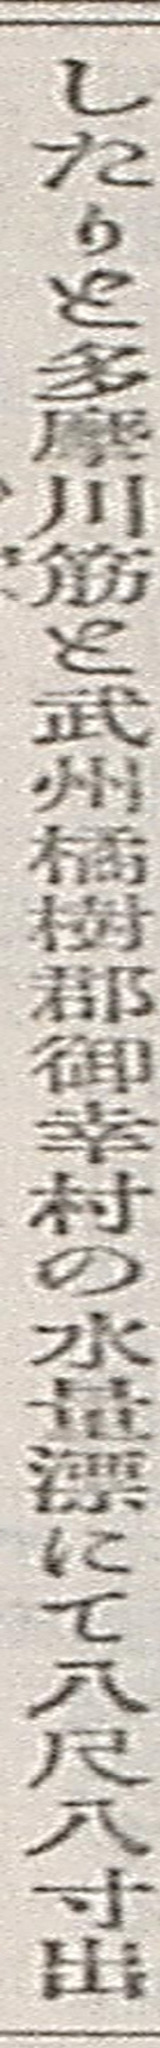したりと多摩川筋と武州橘樹郡御幸村の水量漂にて八尺八寸出
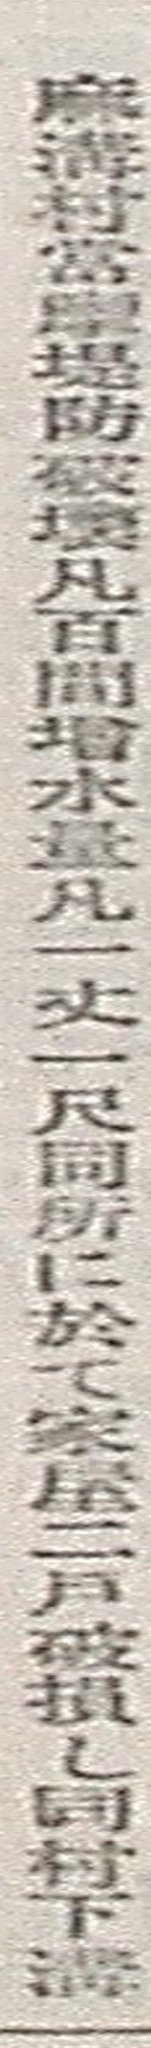麻溝村当摩堤防破壊凡百間増水量凡一丈一尺同所に於て家屋二戸破損し同村下溝
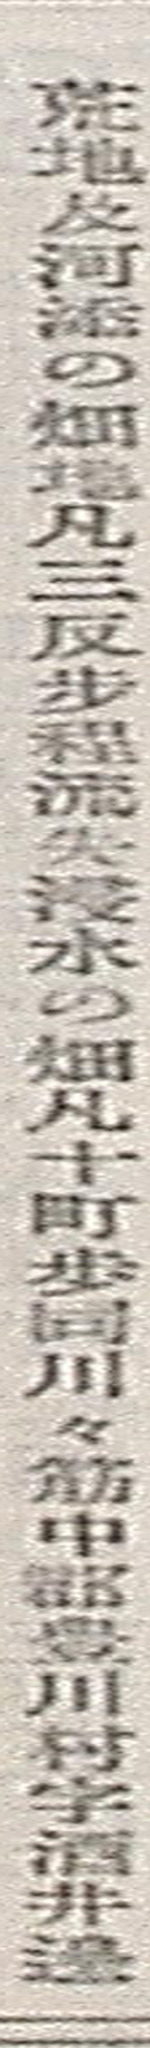荒地及河添の畑地凡三反歩程流失浸水の畑凡十町歩同川々筋中郡豊川村字酒井辺
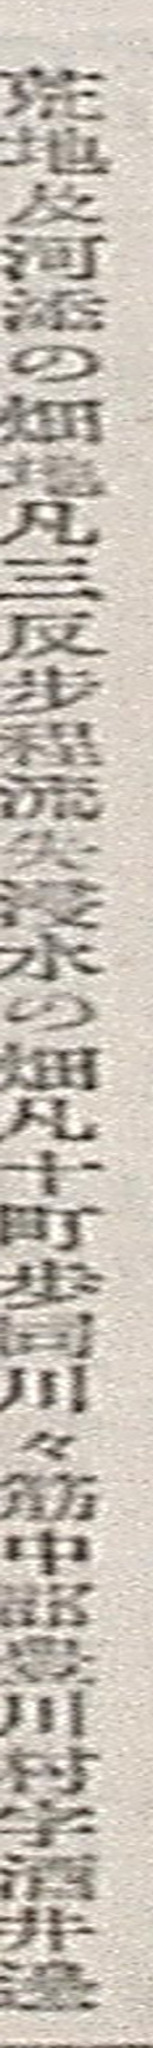荒地及河添の畑地凡三反歩程流失浸水の畑凡十町歩同川々筋中郡豊川村字酒井辺
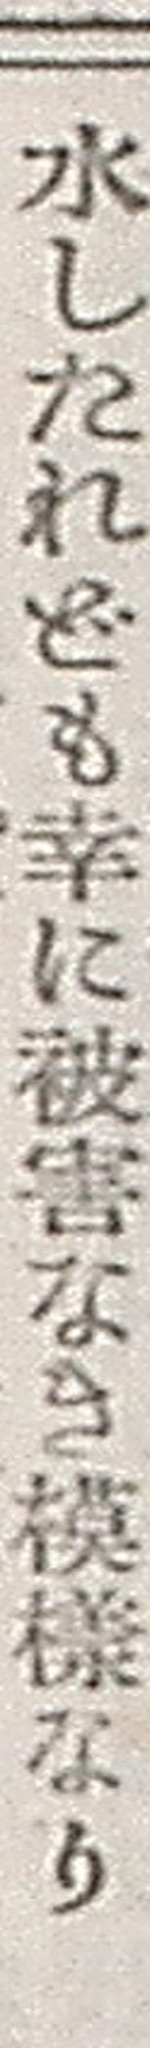水したれども幸に被害なき模様なり
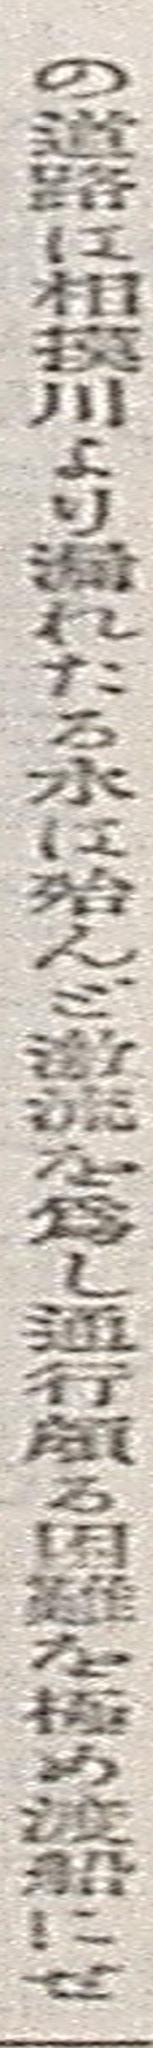の道路は相模川より漏れたる水は殆んど激流を為し通行頗る困難を極め渡船にせ
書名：風俗畫報臨時増刊第百二十八號　洪水被害録（下）
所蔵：東京大学地震研究所図書室 Earthquake Research Institute Library, The University of Tokyo, JAPAN
